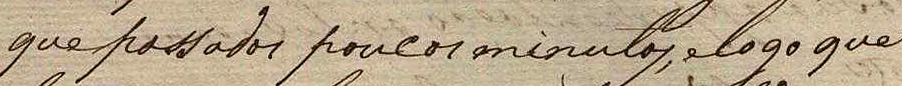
que passados poucos minutos, e logo que
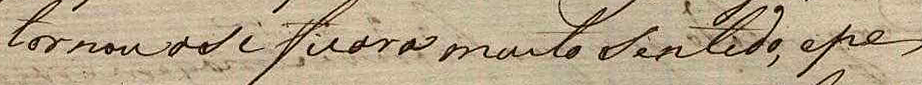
tornou a si ficara muito sentido, e pe
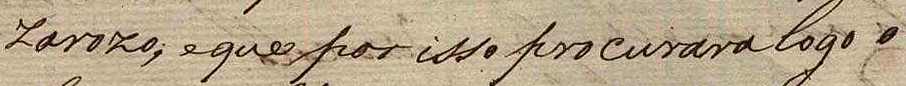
zarozo, e que por isso procurara logo o
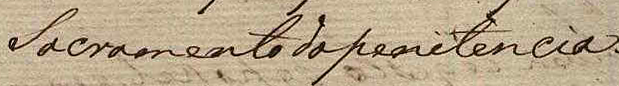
Sacramento da penitencia.
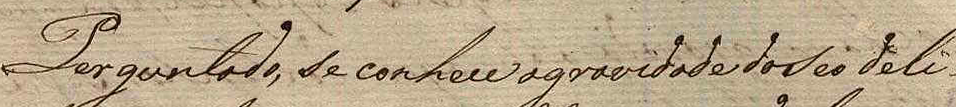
Perguntado, se conhece a gravidade do seo deli
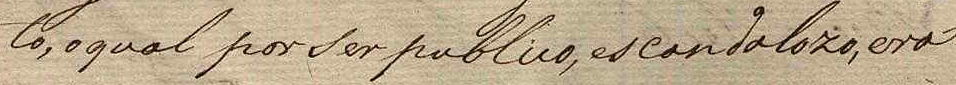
to, o qual por ser publico, escandalozo, era
